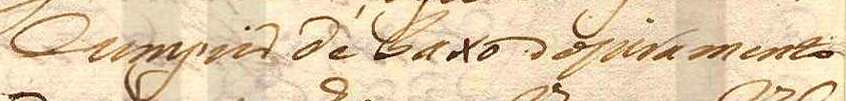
Cumprir debaxo do juramento
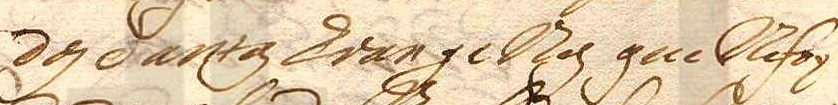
dos Santos Evangelhos, que lhe foy
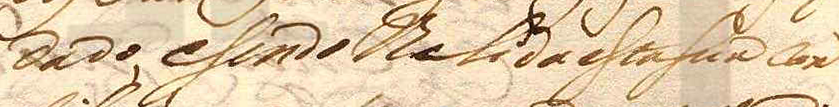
dado, e sendolhe lida esta sua con
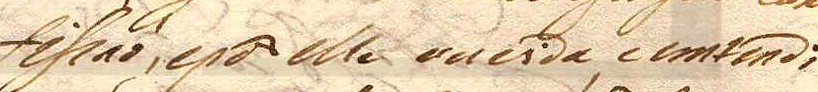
fissaõ, e por elle ouvida e emtendi
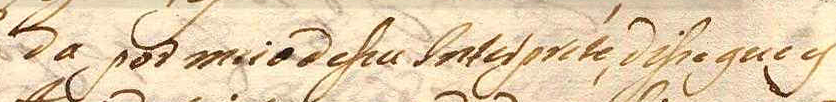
da por meio de seu Interprete, disse que es
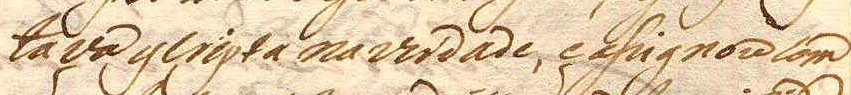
tava escripta na verdade, e assignou com
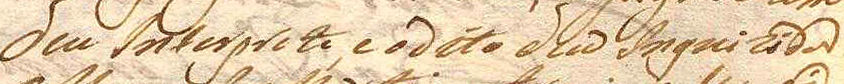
seu Interprete, e o dito seu Inquizidor
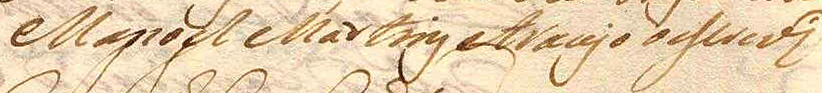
Manoel Martins Araujo o escrevj
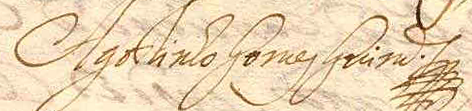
Agostinho Gomes Guim.es
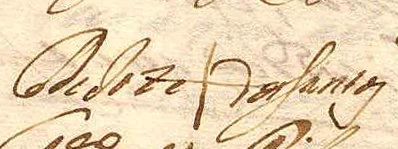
De IoZe + dos santos
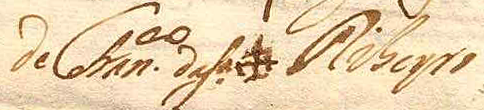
de Fran.co da sa. + Ribeyro
